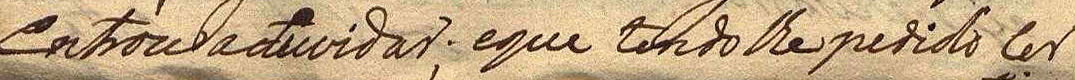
entrou a duvidar; e que tendo lhe pedido cer
